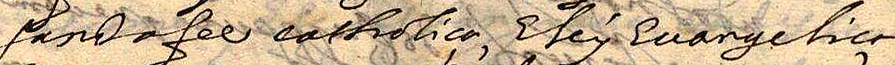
sancta fee catholica, E ley Euangelica
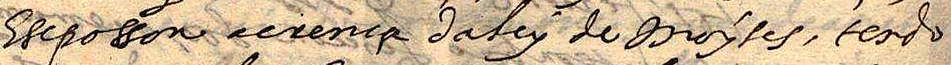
E se passou a crença da ley de Moyses, tendo
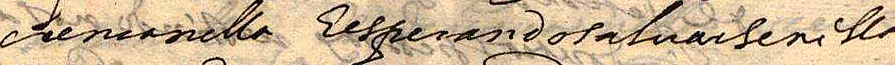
crenca nella E esperando saluarse nella
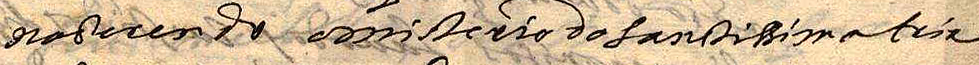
naõ crendo o misterio da sanctissima trin
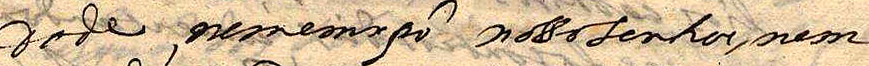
dade, nem em xpō nosso senhor, nem
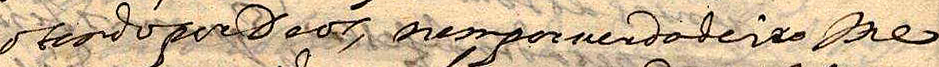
o tendo por Deos, nem por uerdadeiro Me
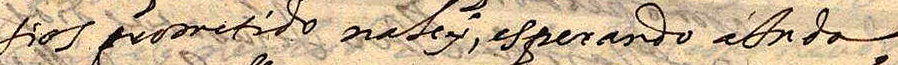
sias prometido na Ley, esperando aInda
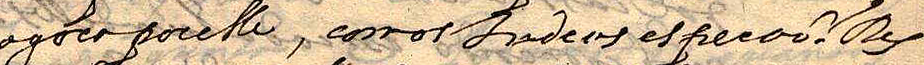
agora por elle, com os Iudeos esperaõ? Res
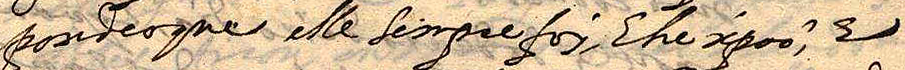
podeo que elle sempre foy, E he xpaõ, E
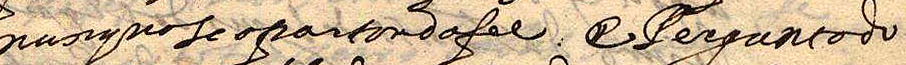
nunqua se apartou da fee. ¶ Perguntado
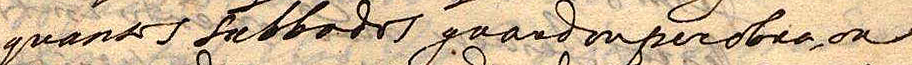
quantos sabbados guardou per obra, ou
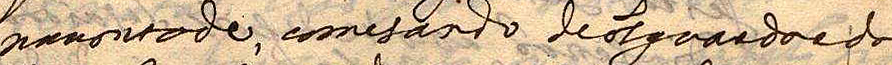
na uontade, comesando de os guardar da
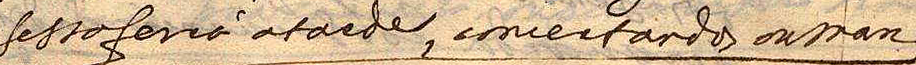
sesta feira a tarde, concertandos ou man
